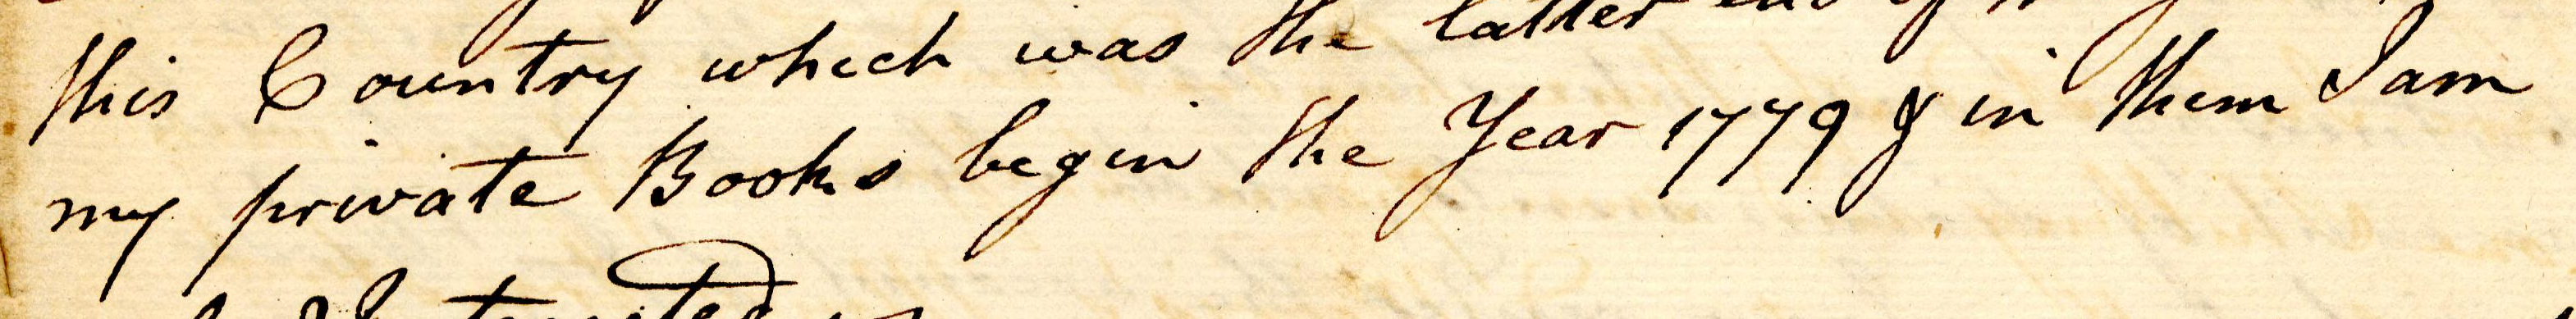my private Books begin the Year 1779 & in them I am
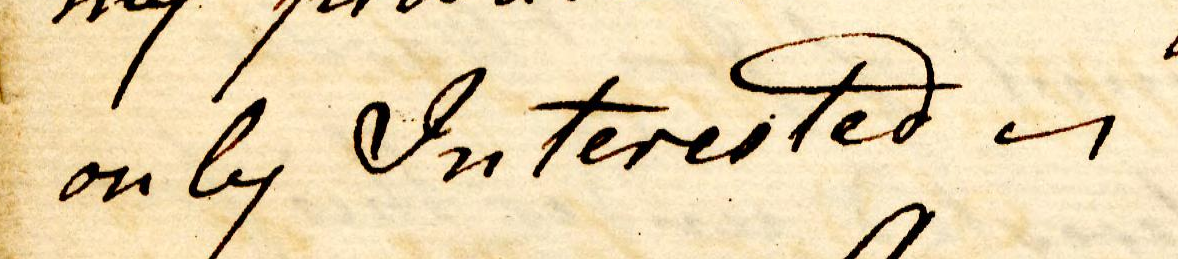only Interested.
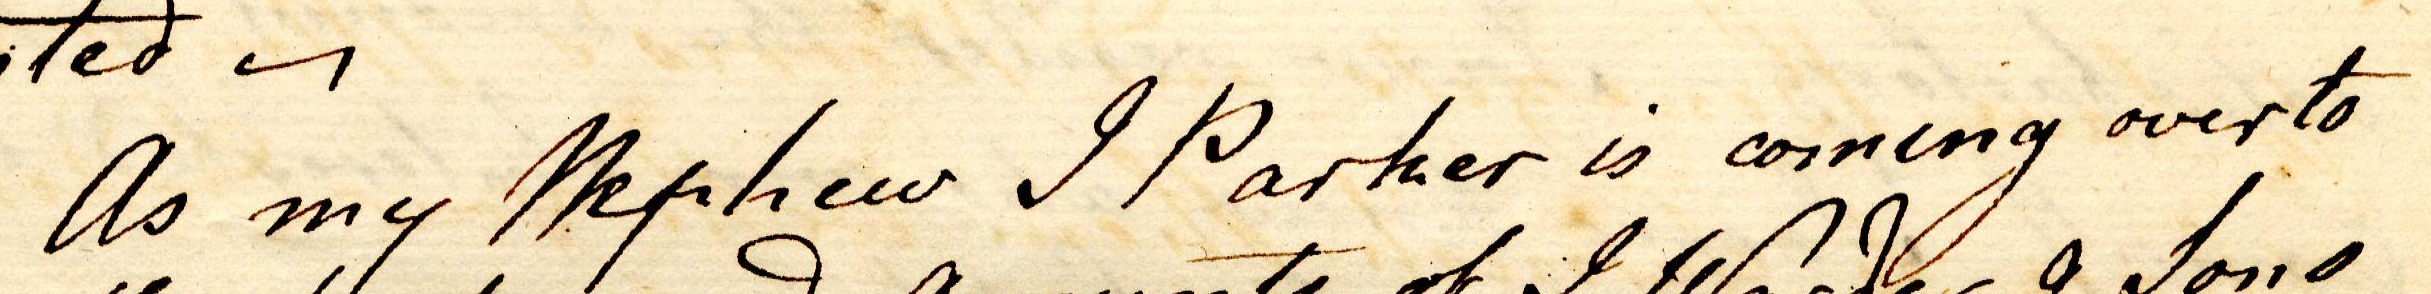As my Nephew I Parker is coming over to
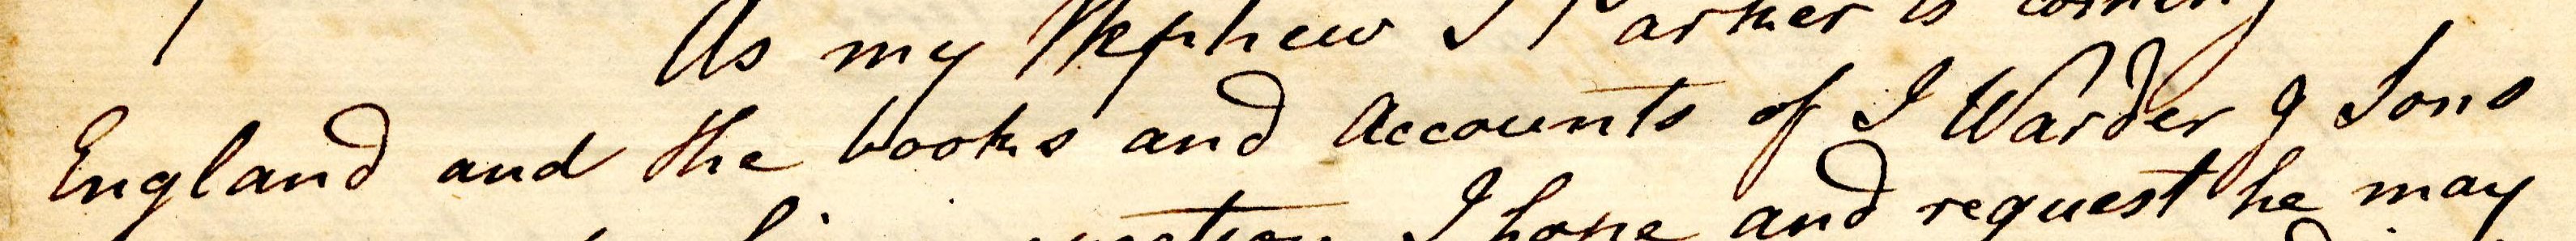England and the books and Accounts of J Warder & Sons
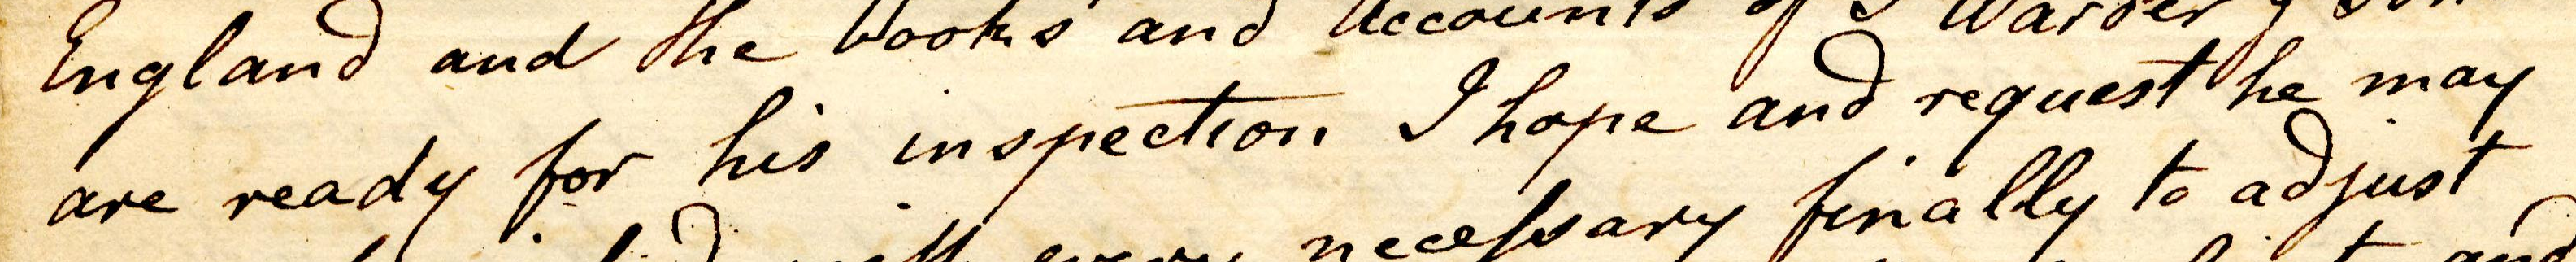are ready for his inspection I hope and request he may
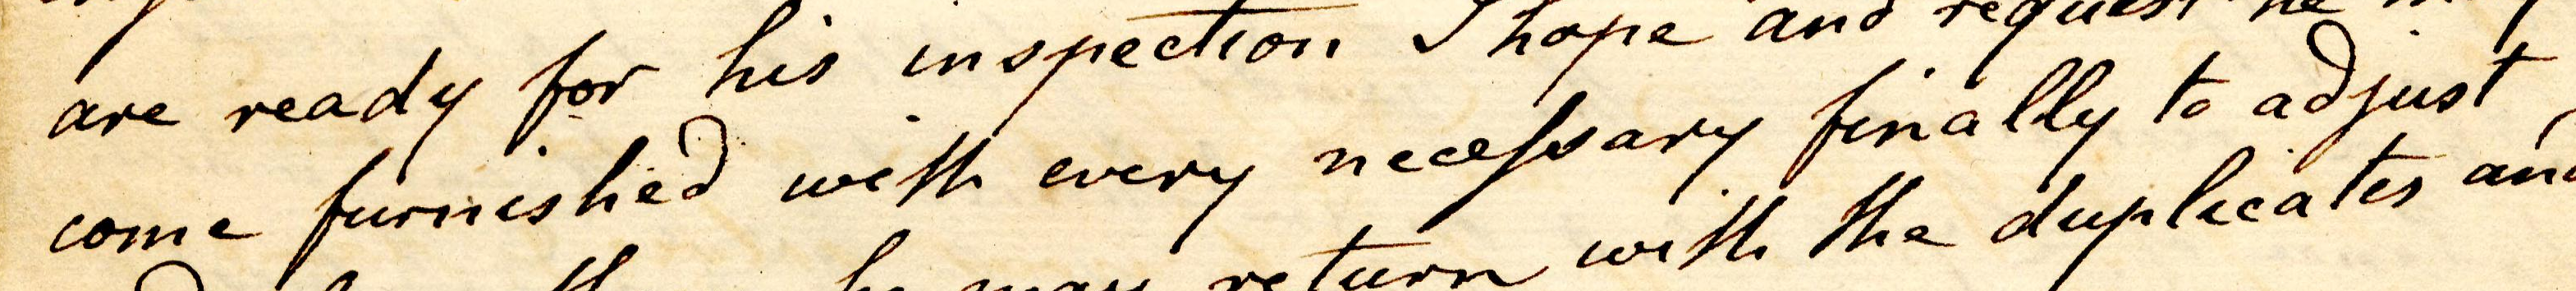come furnished with every necessary finally to adjust
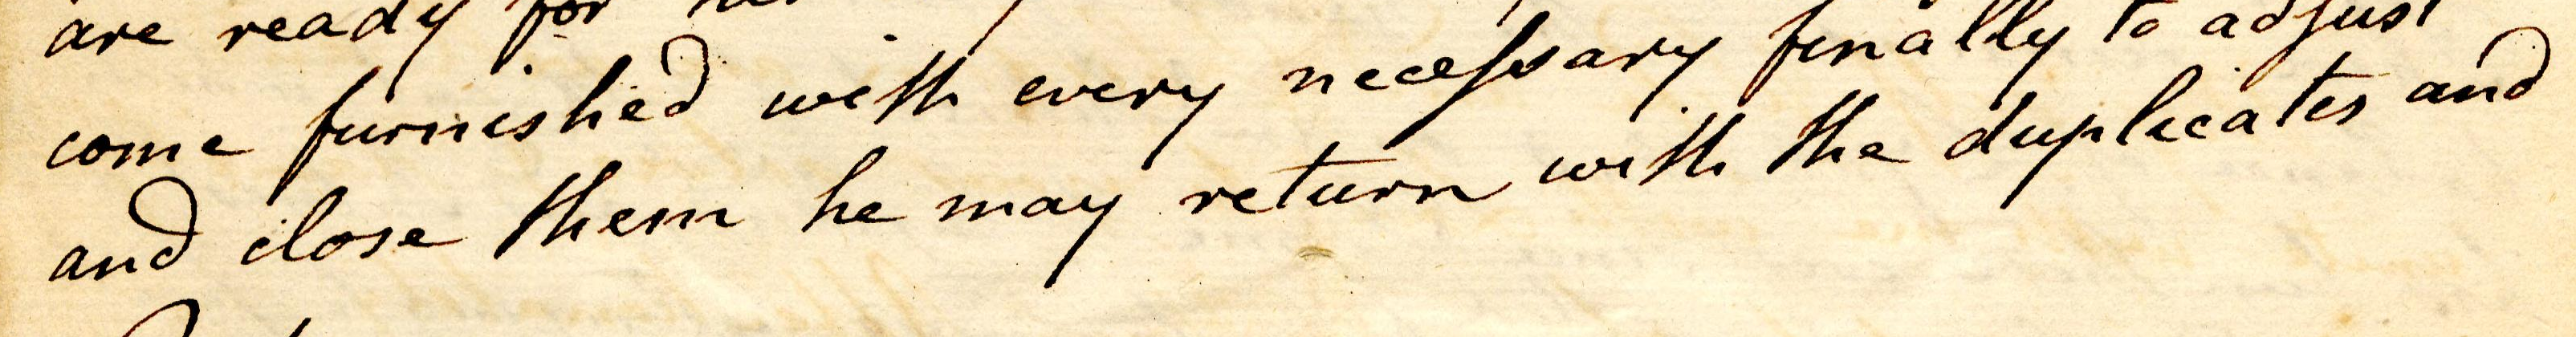and close them he may return with the duplicates and
